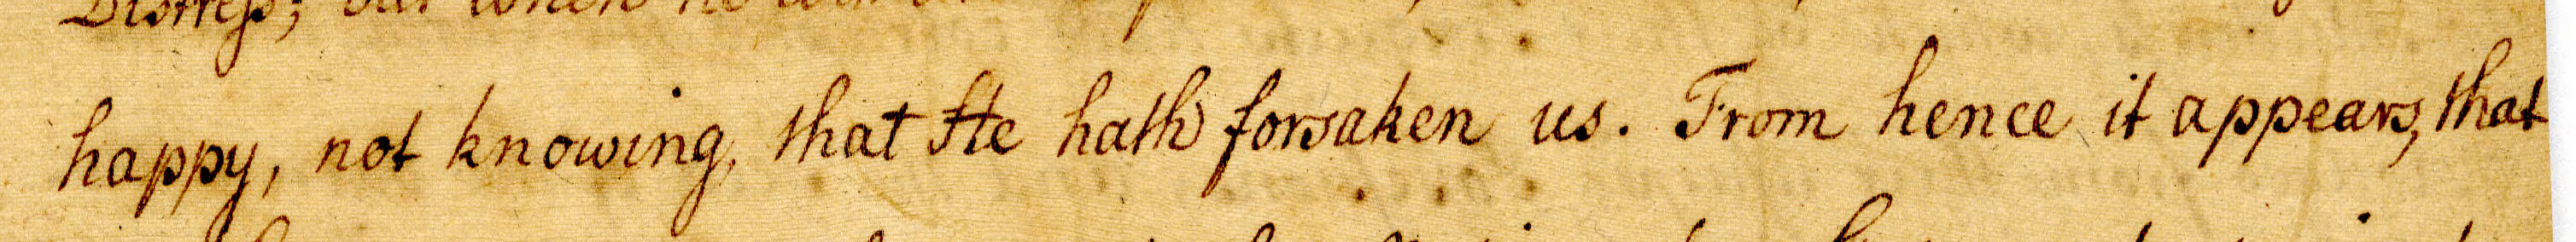happy, not knowing that He hath forsaken us. From hence it appears, that
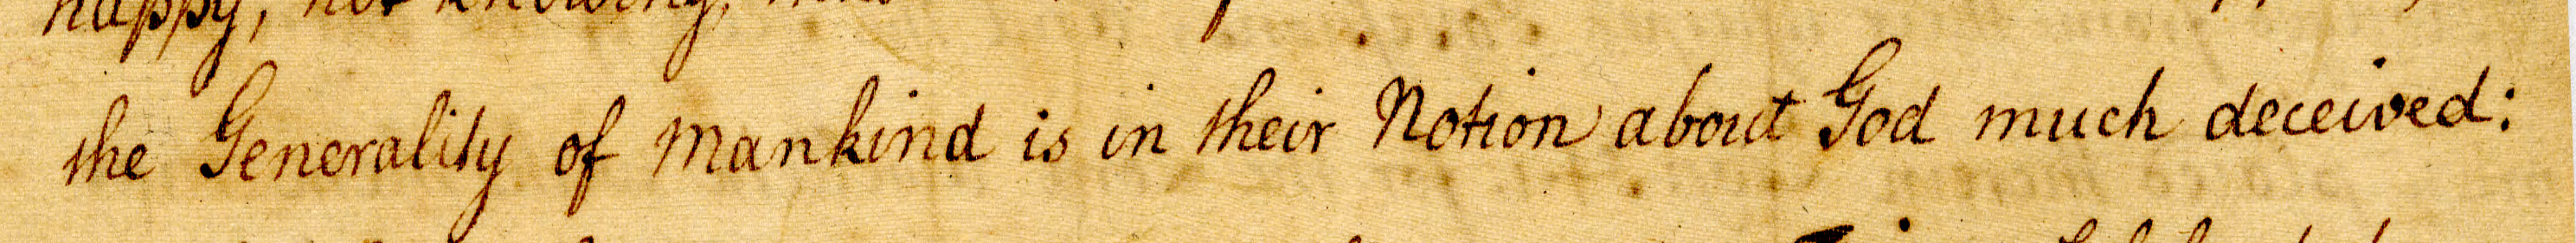the Generality of mankind is in their Notion about God much deceived:
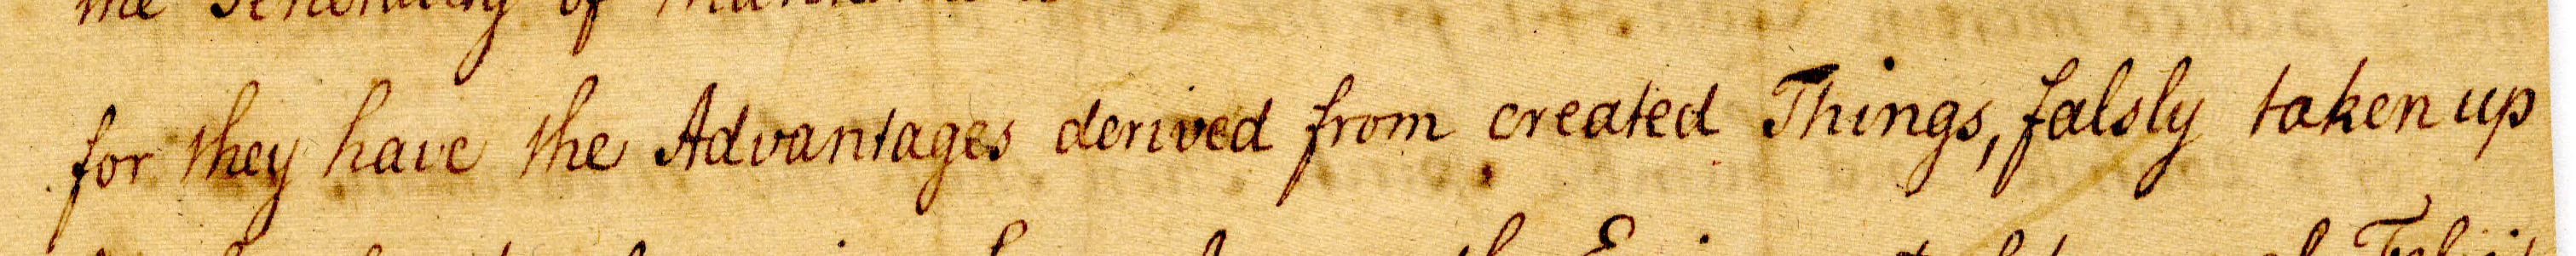for they have the Advantages derived from created Things, falsly taken up
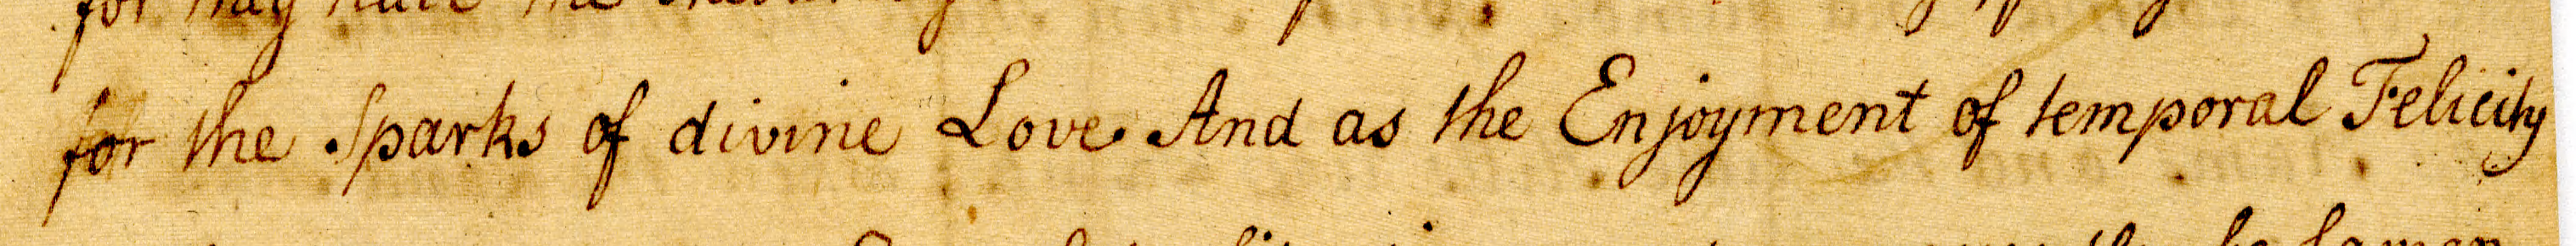for the sparks of divine Love And as the Enjoyment of temporal Felicity
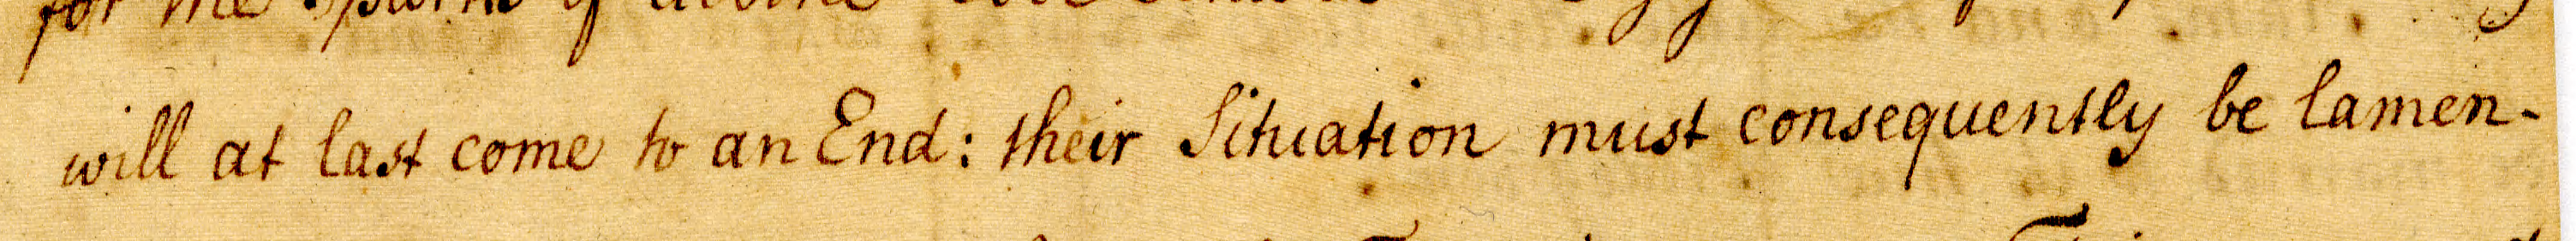will at last come to an End: their situation must consequently be lamen-
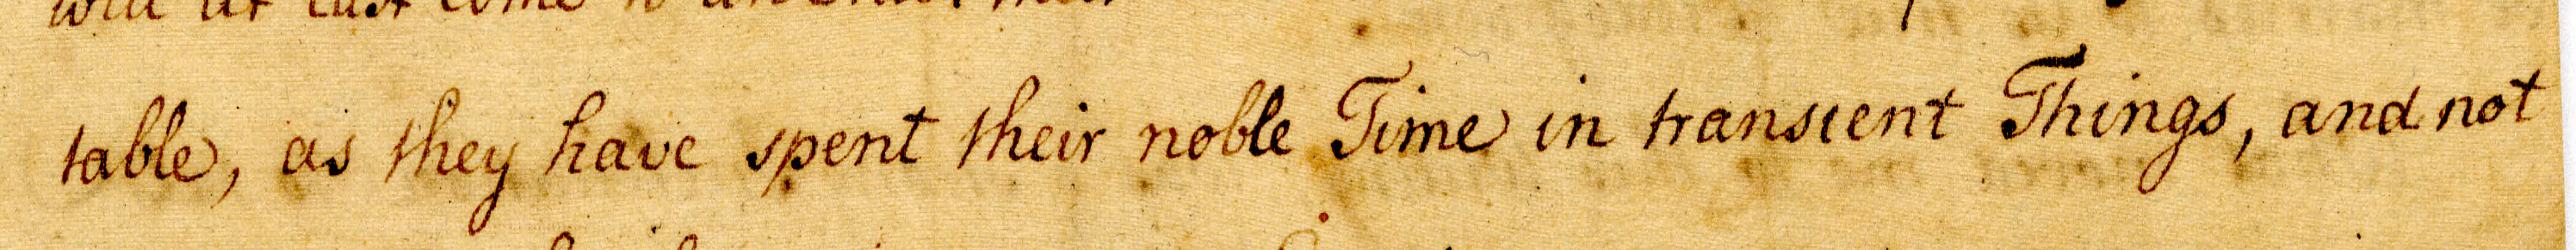table as they have spent their noble Time in the transient Things, and not
